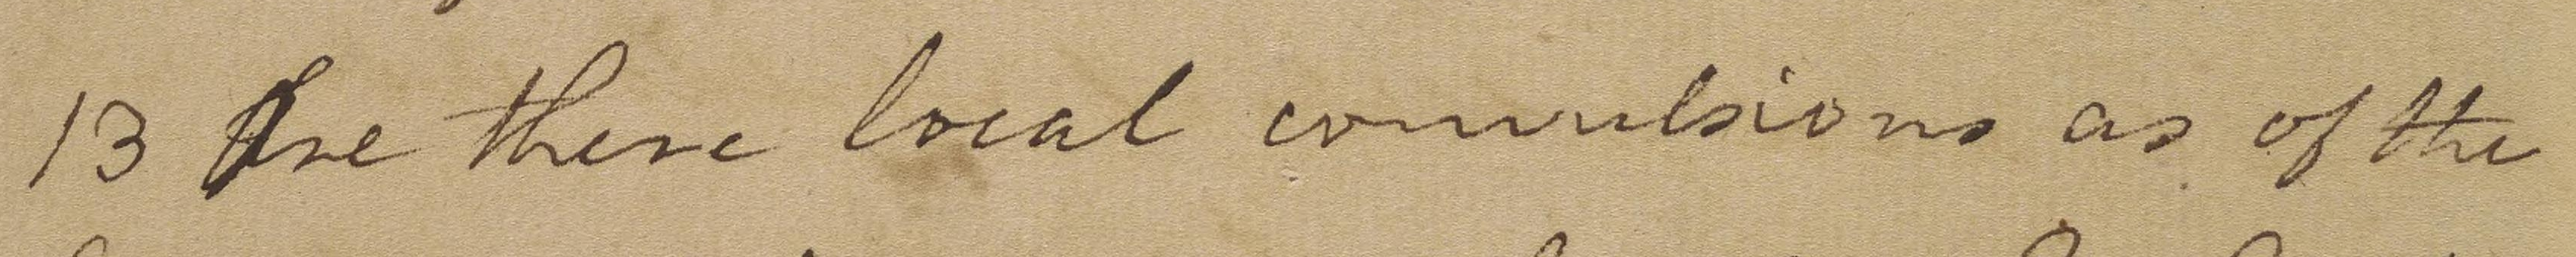13 Are there local convulsions as of the
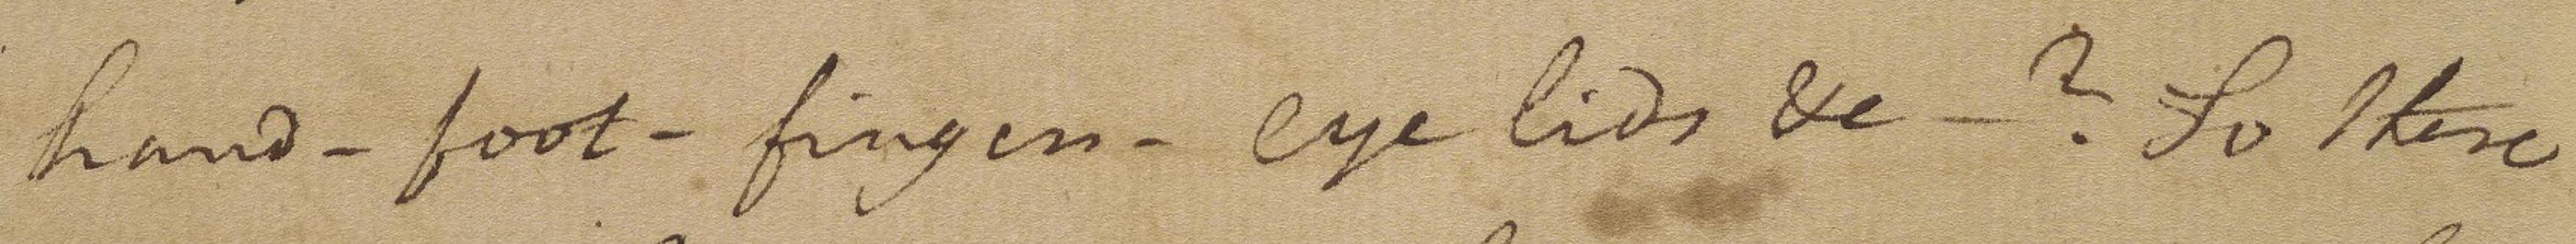hand, foot, finger, eyelids, &c-? So there
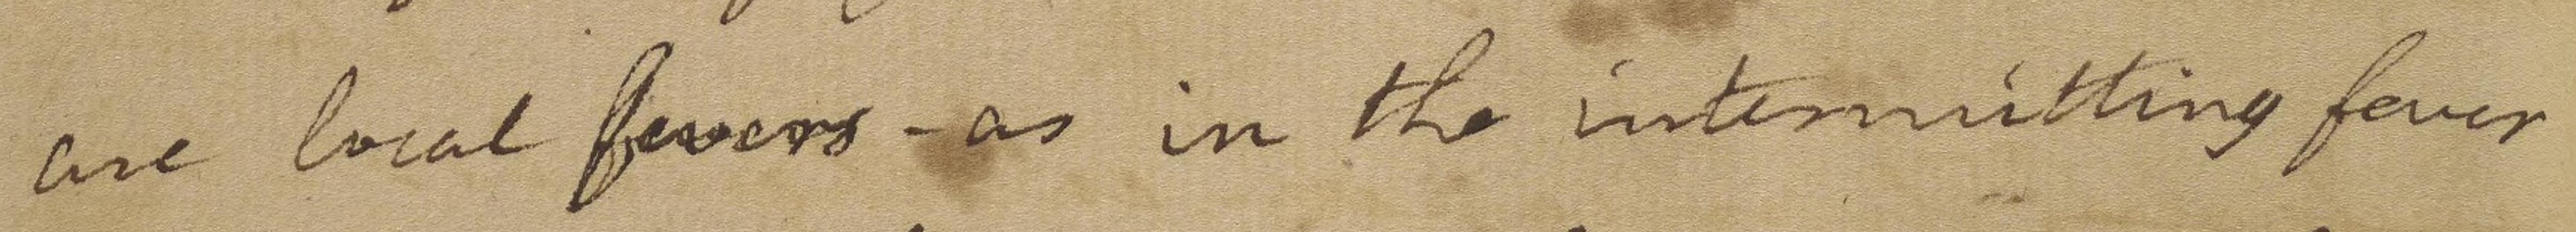are local fevers, as in the intermitting fever
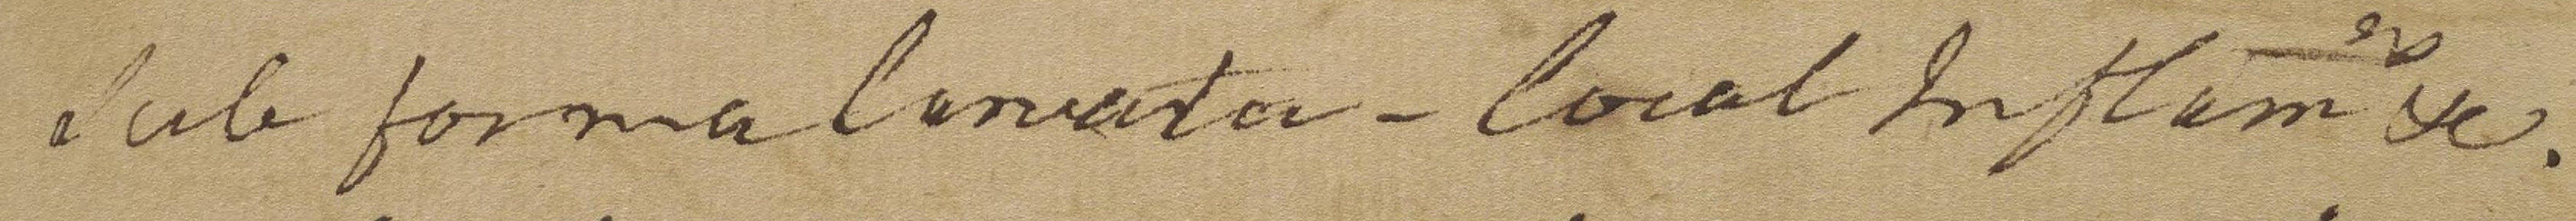form a laniator, local inflam^y &c
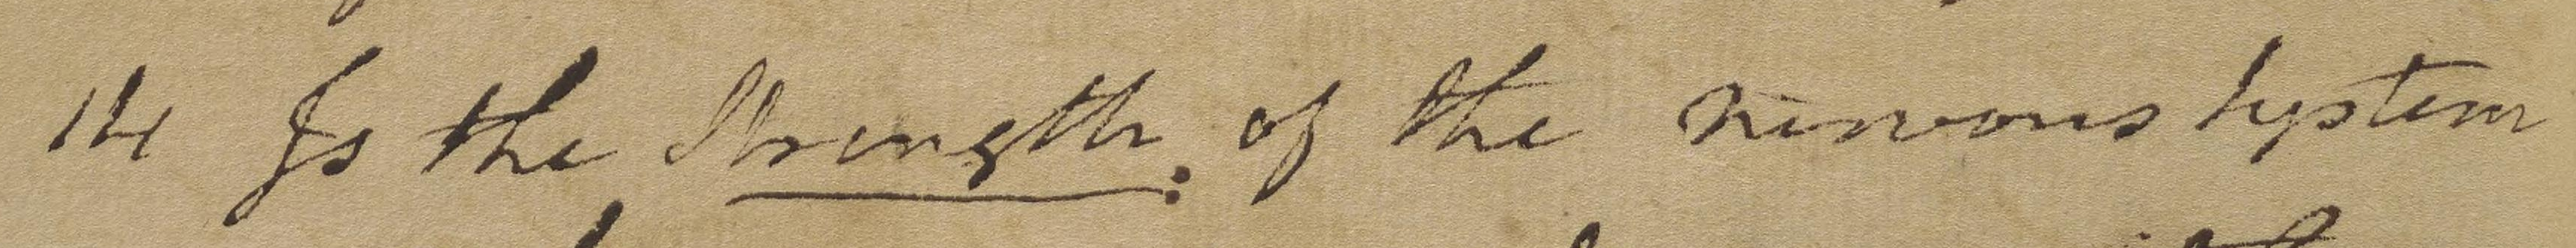14 Isthe strength of the nervous system
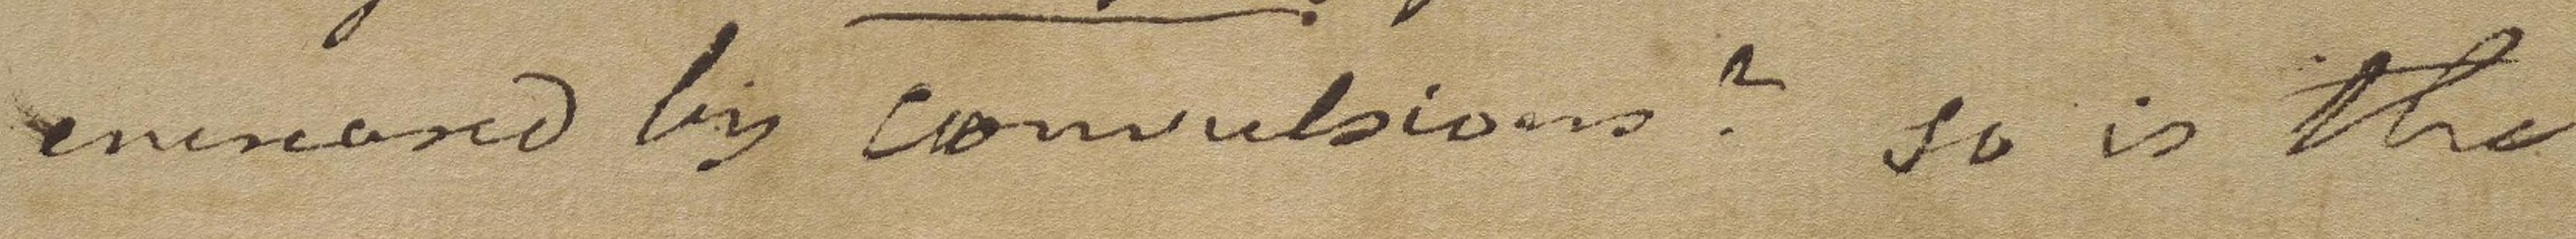encreased by convulsions? So is the
